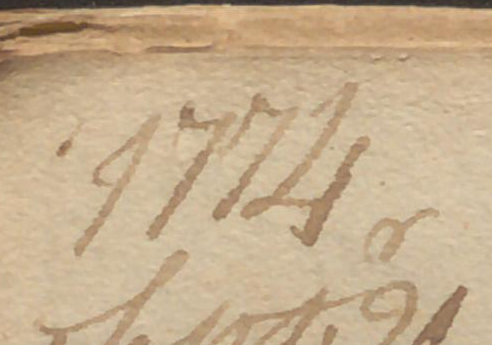1774
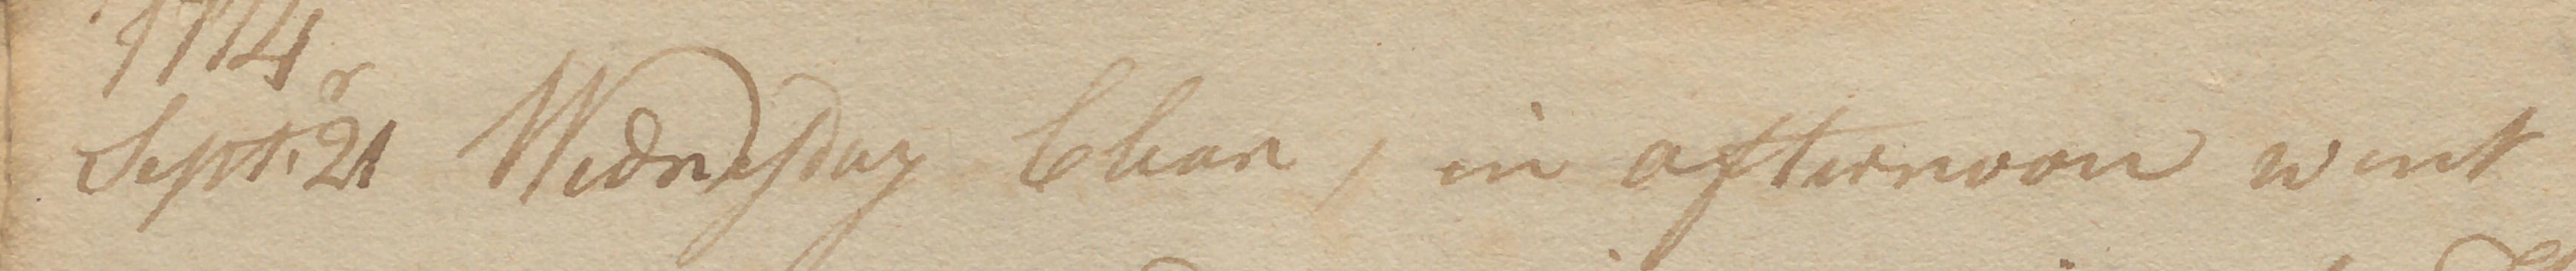Sept^r. 21 Wednesday Clear, in afternoon went
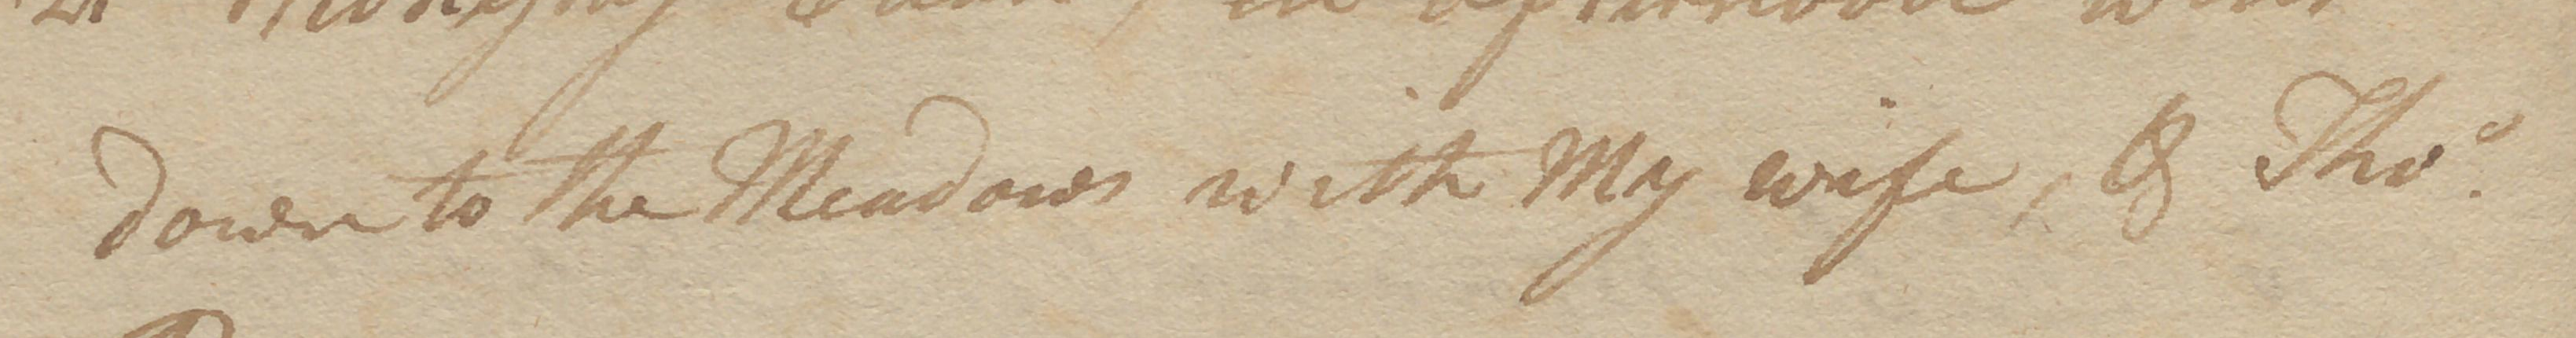down to the Meadows with My wife, & Tho^s.
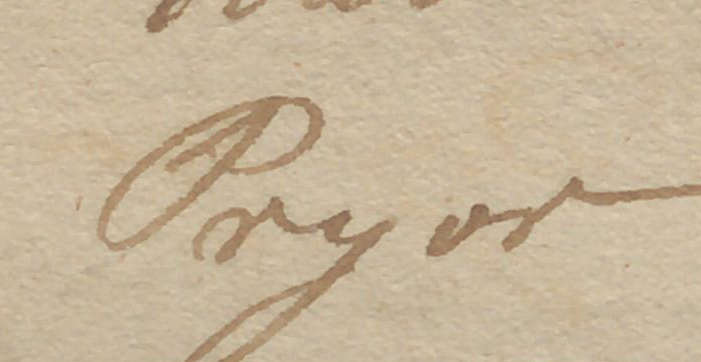Pryor
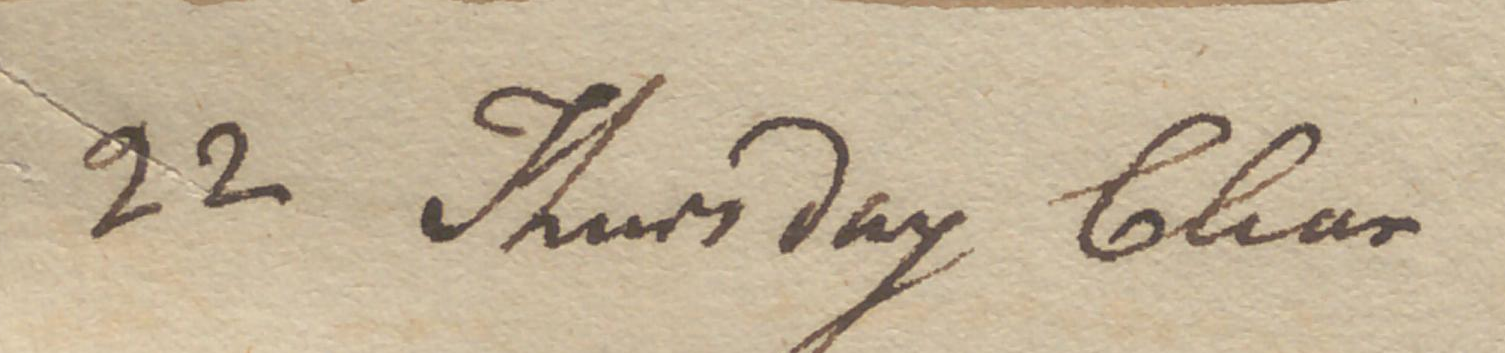22 Thursday Clear
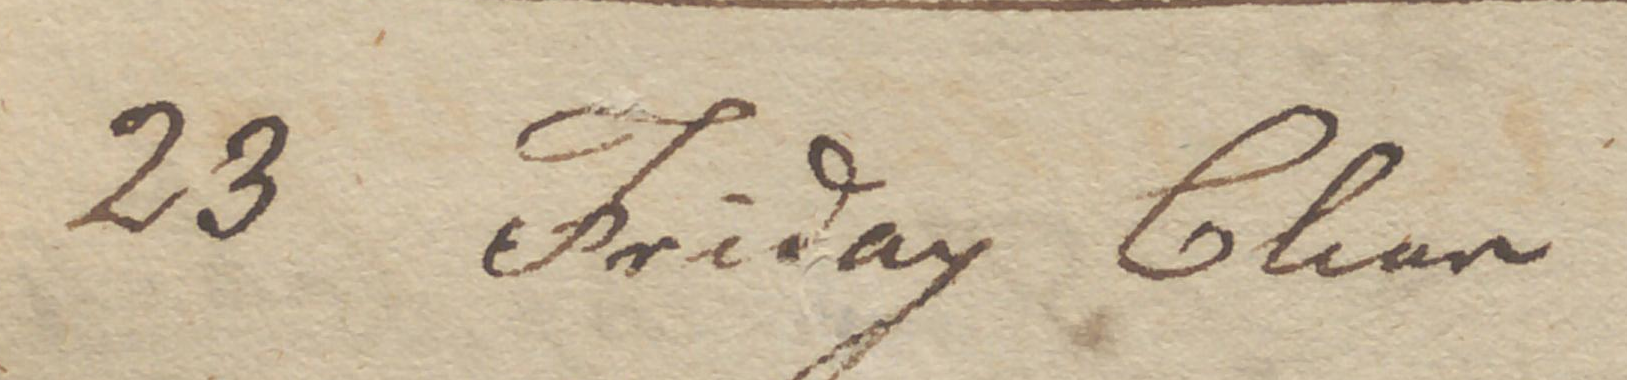23 Friday Clear
